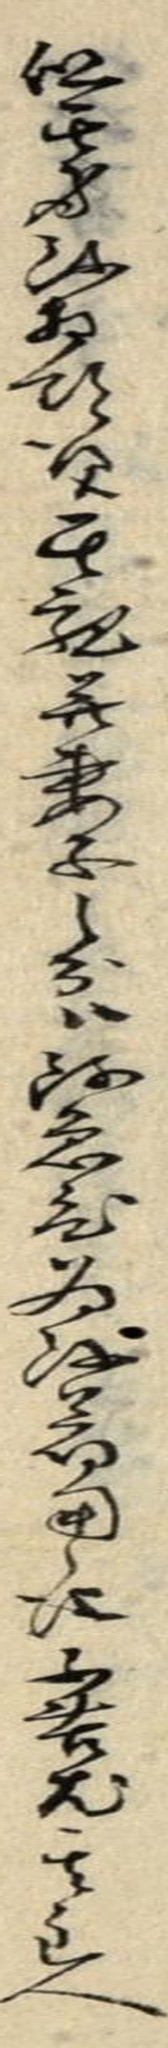但其身致拝領候得共其親并妻子之分は致急度為致着用候儀不苦尤其主人

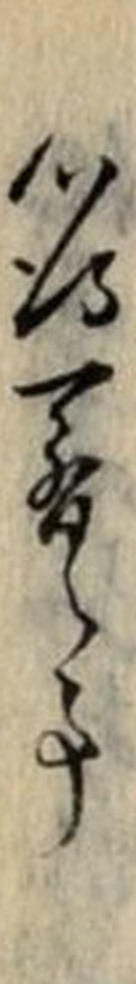心得可有之候事
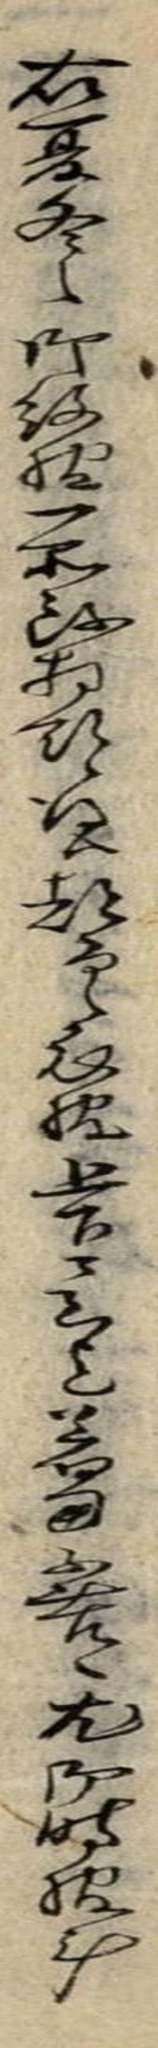右夏冬之御紋服一品致拝領候得共都而之衣服上下に至迄着用不苦候尤御時服斗
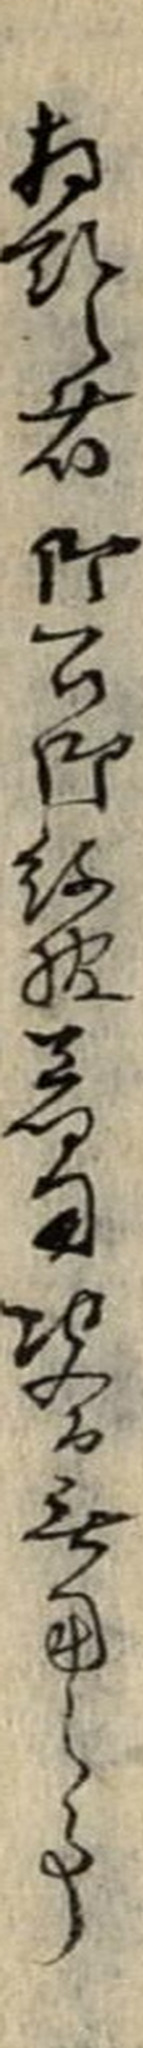拝領之者御召御紋服着用決而無用之事
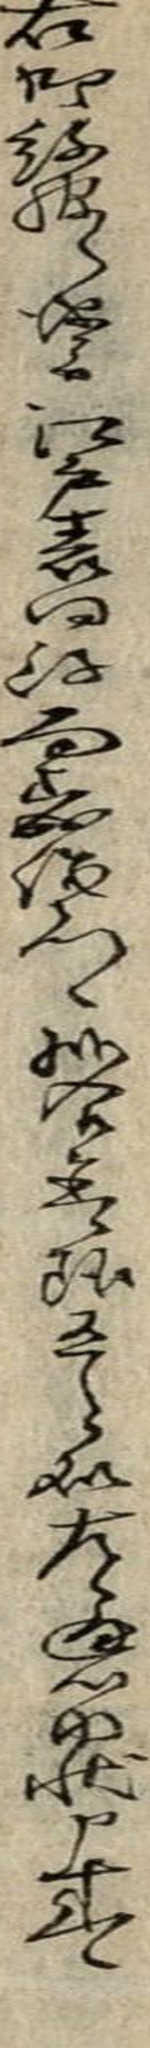右御紋服之儀に付江戸表同役雨森儀右衛門へ掛合候趣有之候処左之通以内状申来候
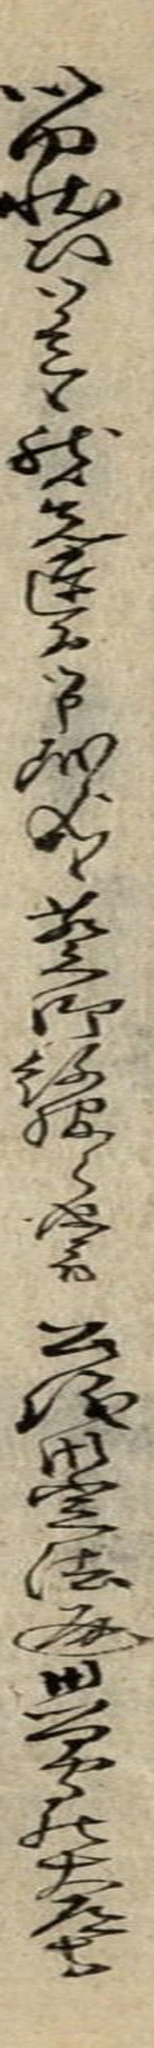以内状得御意候然は先達而御申越被成候葵御紋服之儀に付公儀御定法通御留守居大道寺
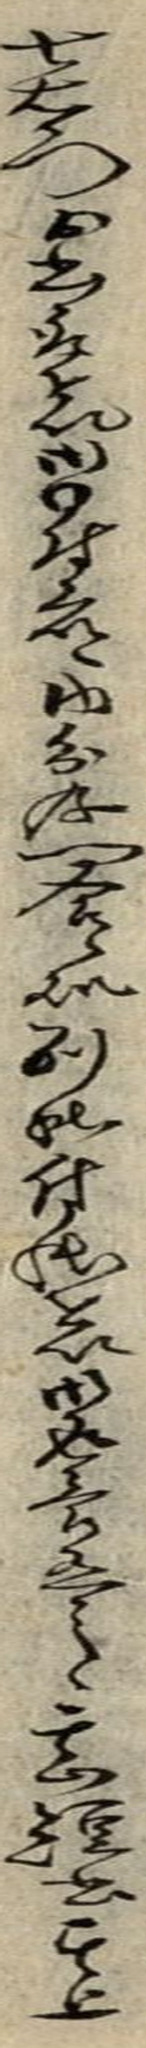七右衛門ゟ書付を以御目付衆へ内分及問合候処別紙付紙を以御返答有之候甚短書其上
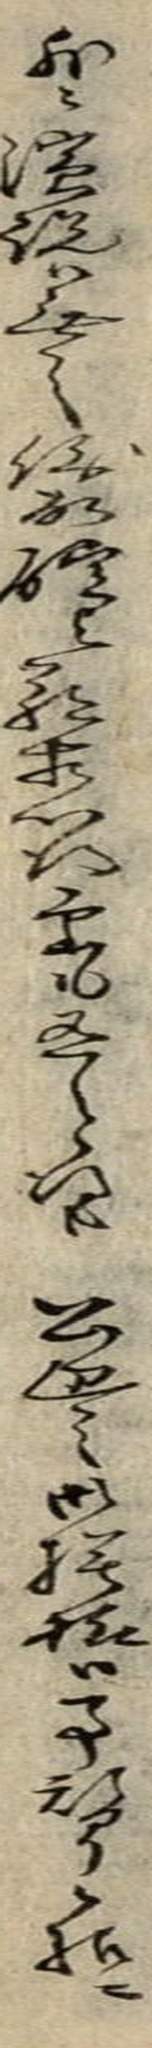外に演説は無之儀故聢と難相心得処も有之候得共公辺之御模様は事替り候様に
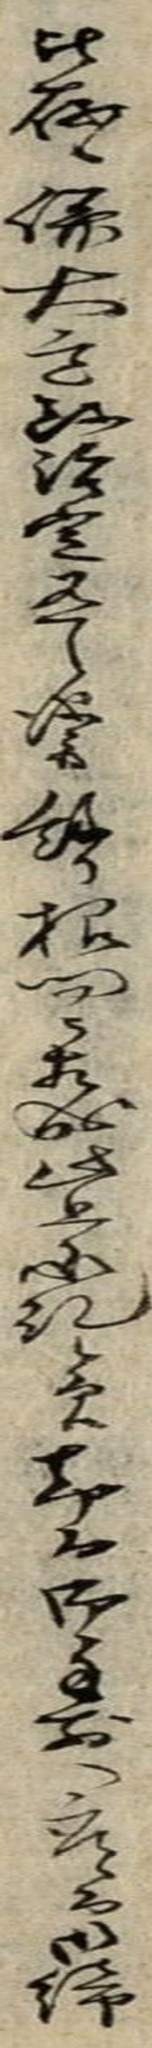被存候併大意改治定有之候儀に付餘り根問に相成此上御承糺に而は却而御手前へ取候而御締
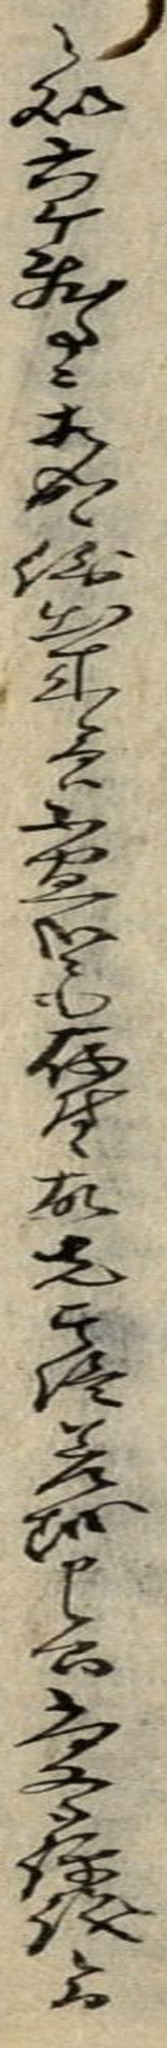之処六ヶ敷事に相成候儀出来候而は不宜哉とも存付候故先其侭差越申候間尚又御評議に而
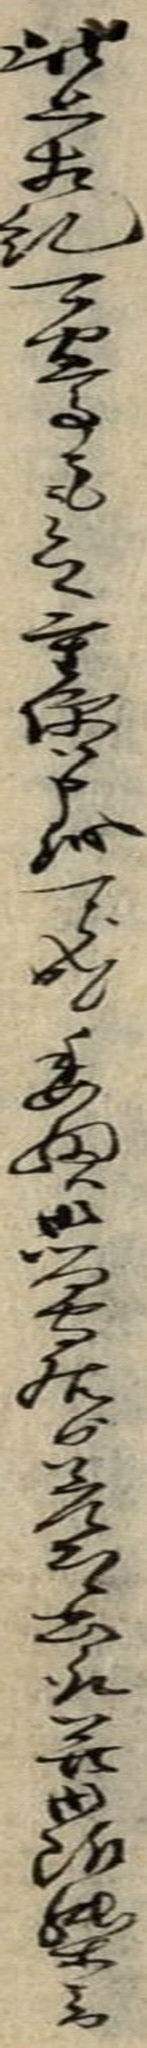此上相糺可宜事にも候はゝ重便御申越可被成候委細は御留守居ゟ差出候書取并御附紙等に而
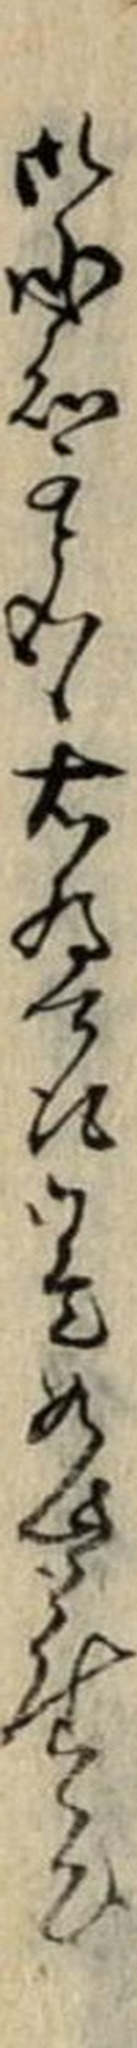御承知可被成候右為被得御意如此御座候以上
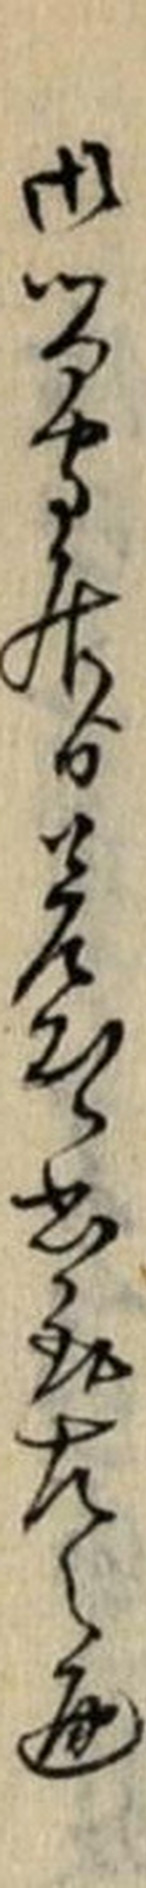御留守居ゟ差出候書取左之通
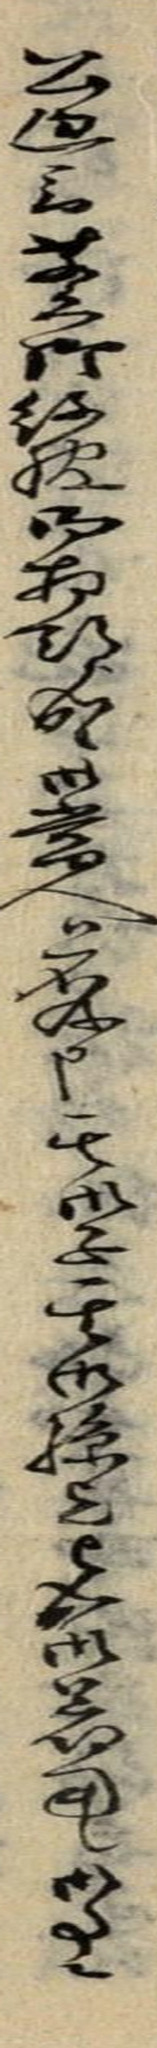公辺に而葵御紋服御拝領被成候御当人は不及申其御子其御孫迄被成御着用候御事候に
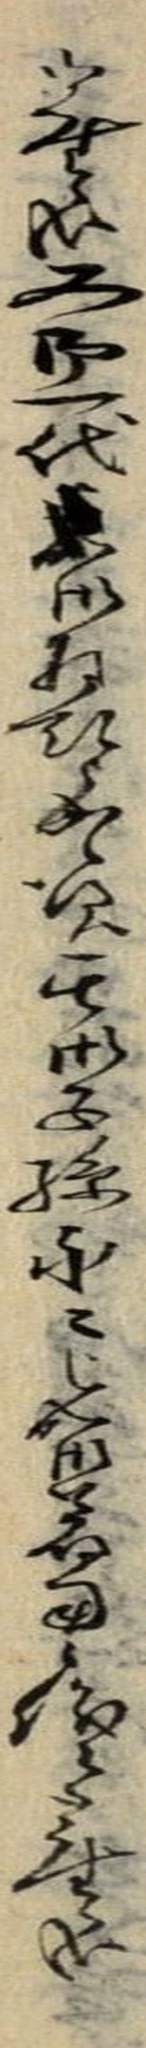御座候哉又御一代御拝領被成候得は其御子孫永々被成御着用之儀に御座候哉
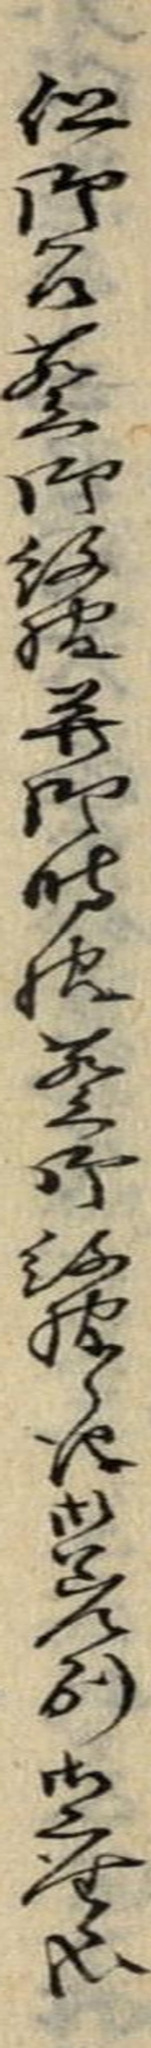但御召葵御紋服并御時服葵御紋服之儀御差別御座候哉
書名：蒐輯之部
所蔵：福井県文書館 Fukui Prefectural Archives
